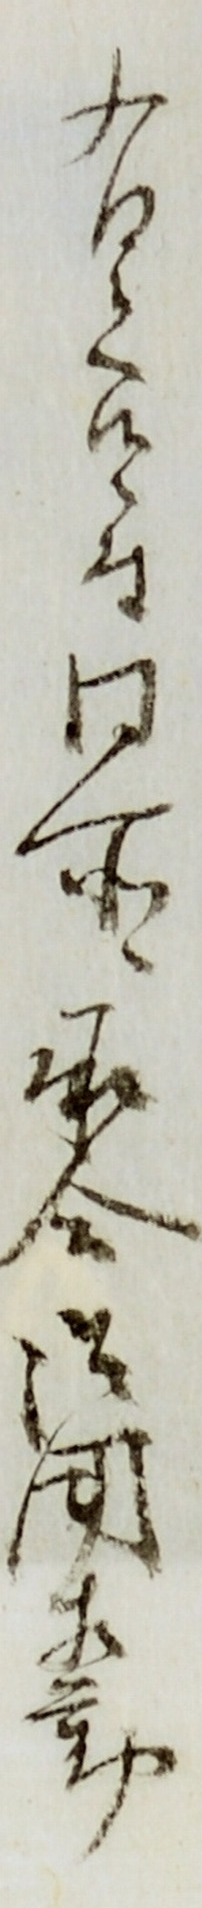有之候に付同所へ承合御用相勤
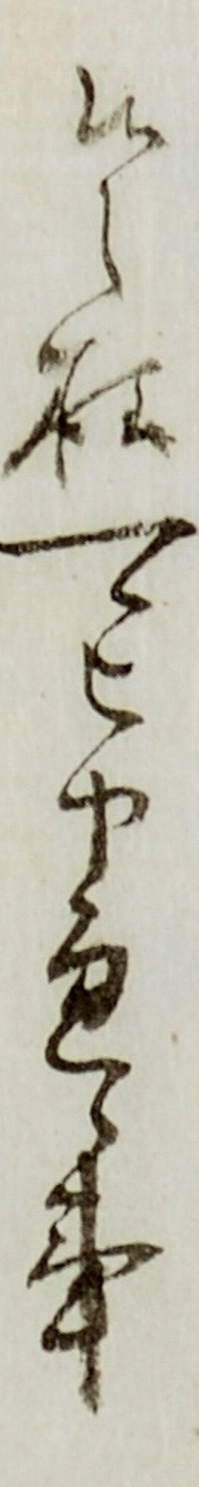候之様可被申通候事
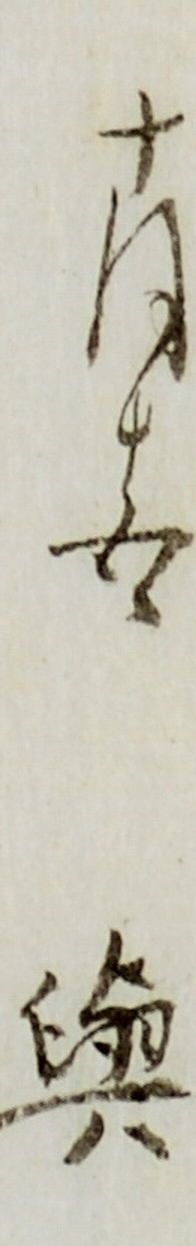十月十五日与
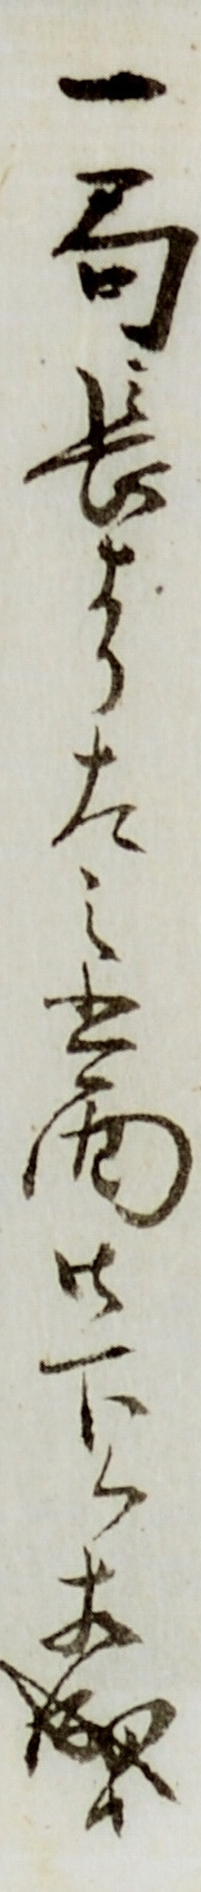一局長より左之書面御下ヶ相成候
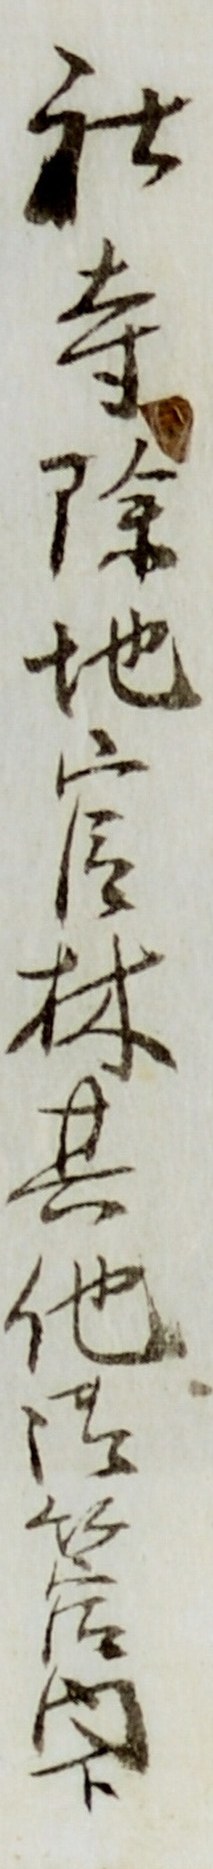社寺除地官林其他御管内下
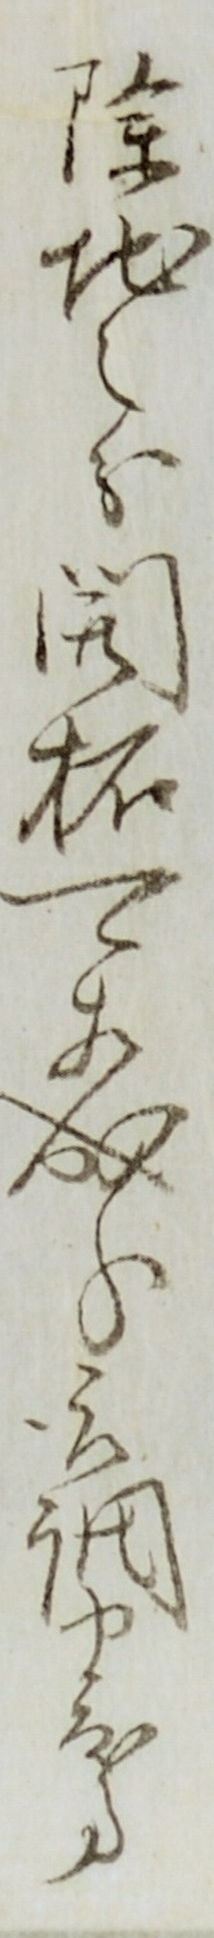除地之分開拓可相成分取調申度事
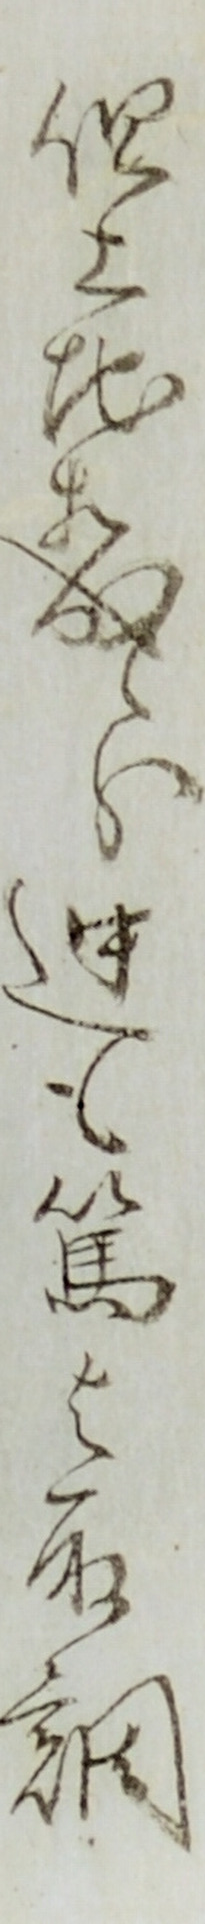但上地相成候分迚も篤と取調

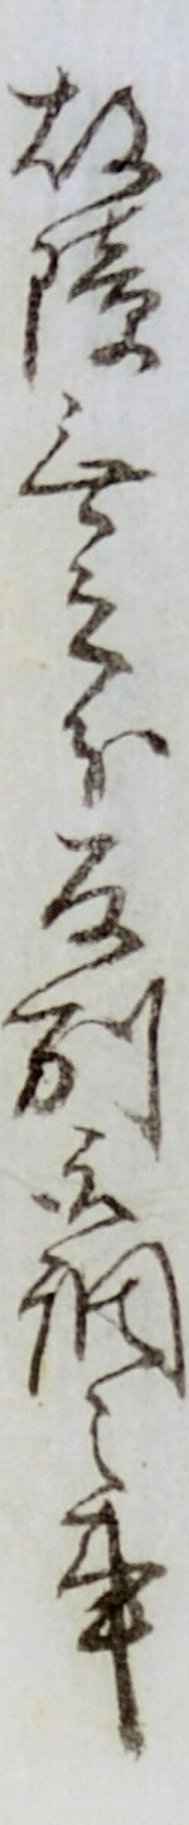故障無之分反別取調之事
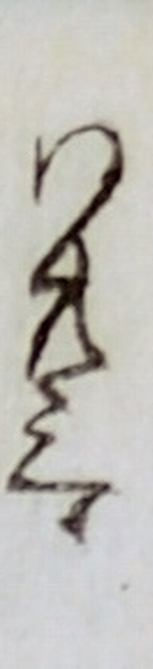同廿三日
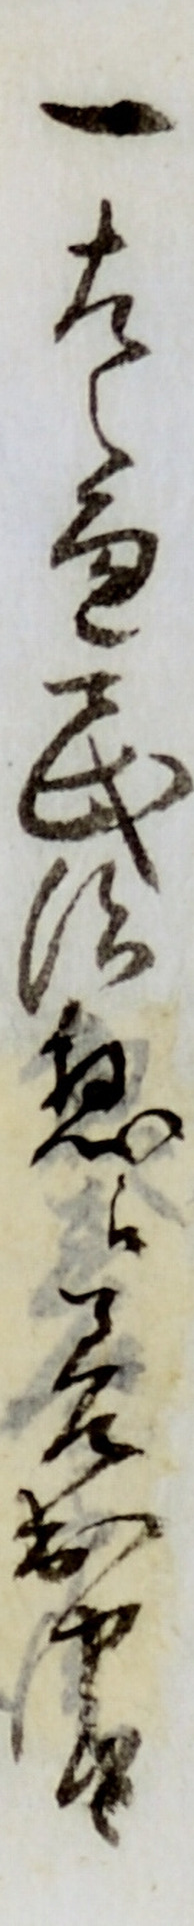一左之通民治懸え差出申候
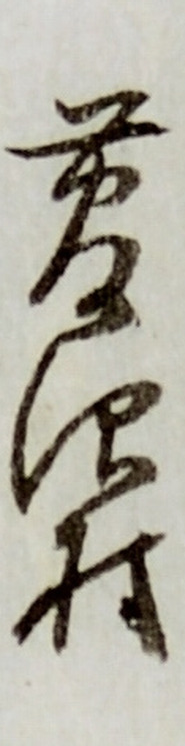菅沼村
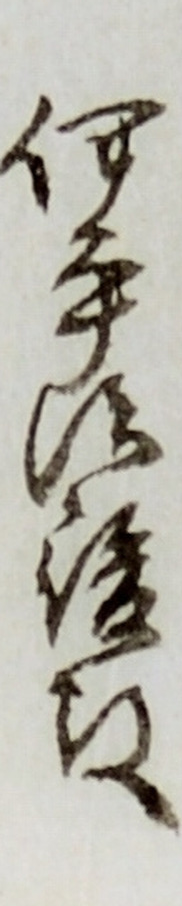伊平治後役
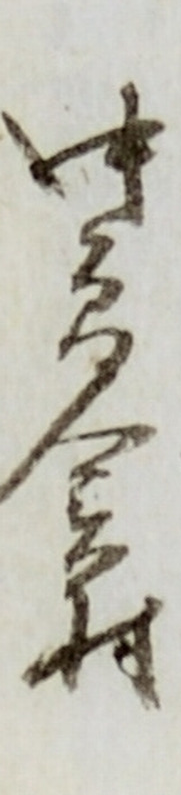中曽倉村
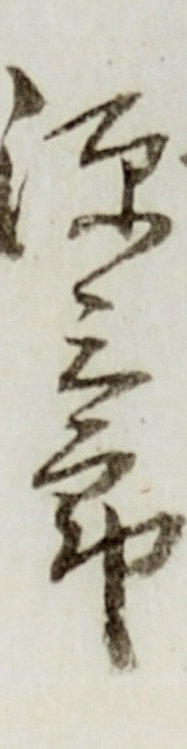源三郎
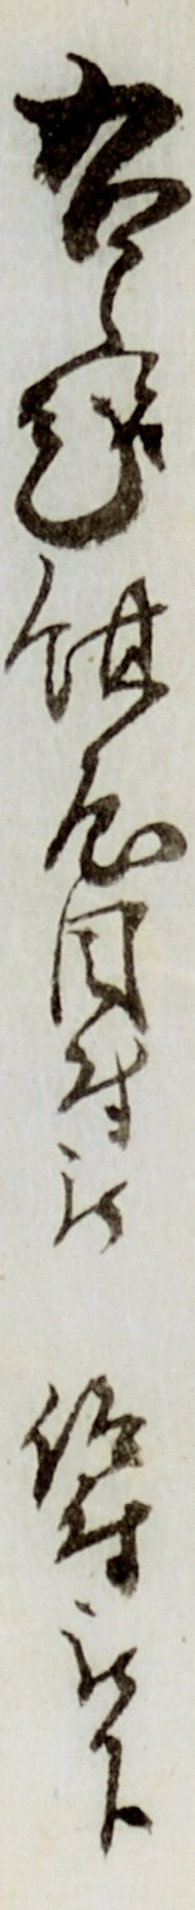右之趣紺屋目付被仰付被下
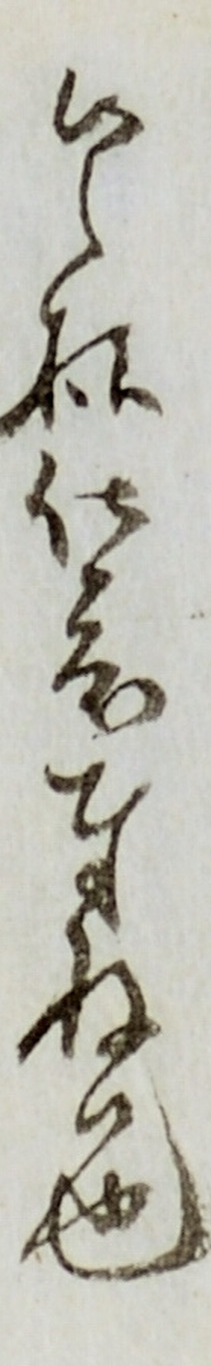候之様仕度奉存候也
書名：山林方諸事御用留
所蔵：伊那市立高遠町図書館・合同会社AMANE
